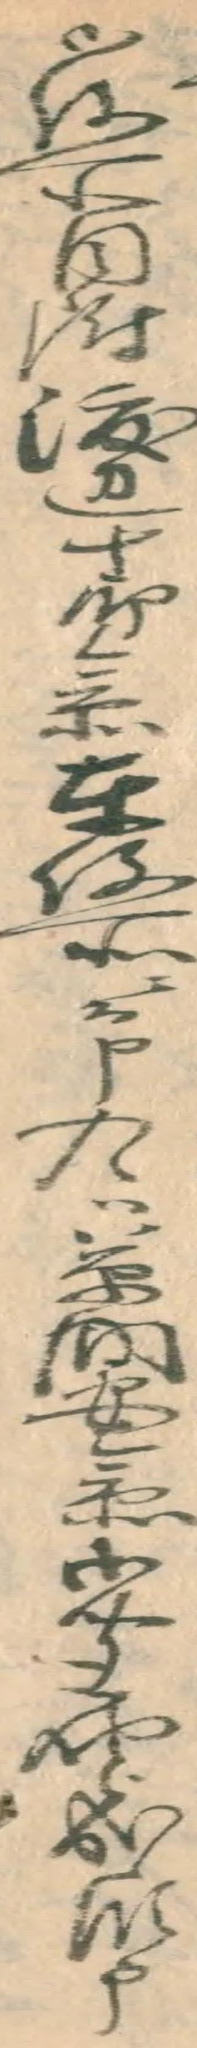御役所目付渡辺十郎兵衛東役所ニ而申入候ハ草間安兵衛御聞届被成候段申
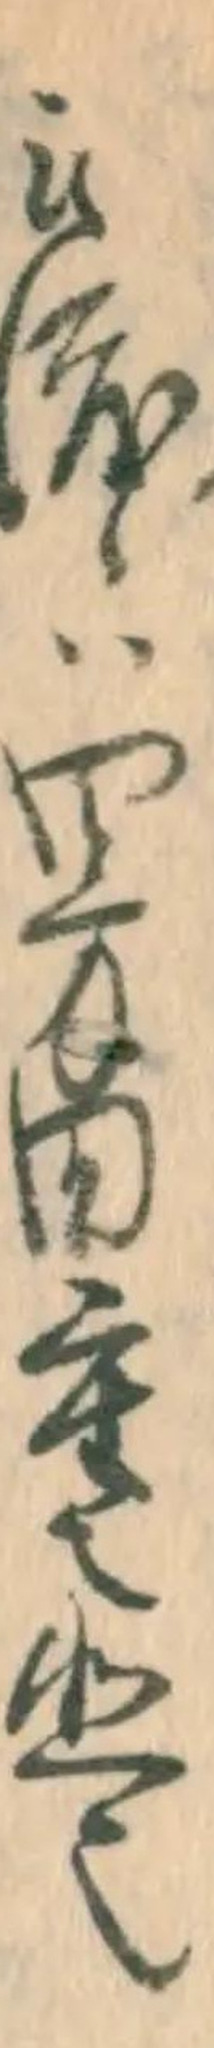被渡候ハ四方田重之丞也
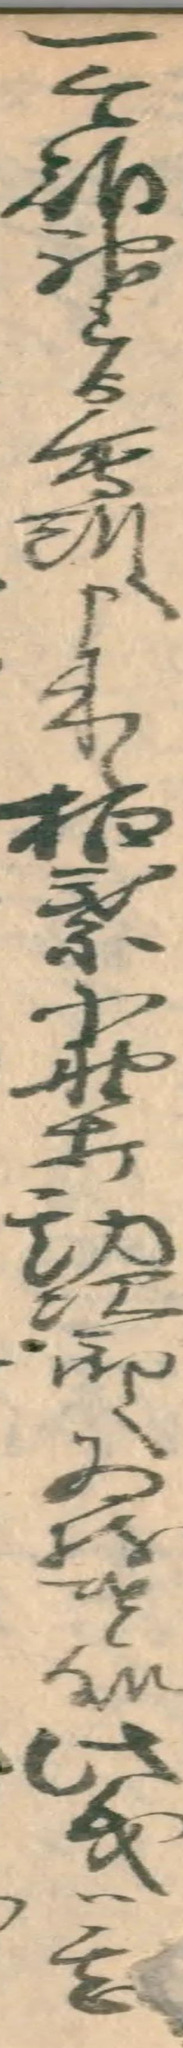一今朝神主ゟ会所へ申来候柏葉小野打勘次郎へ為持遣候処此義ハ甚
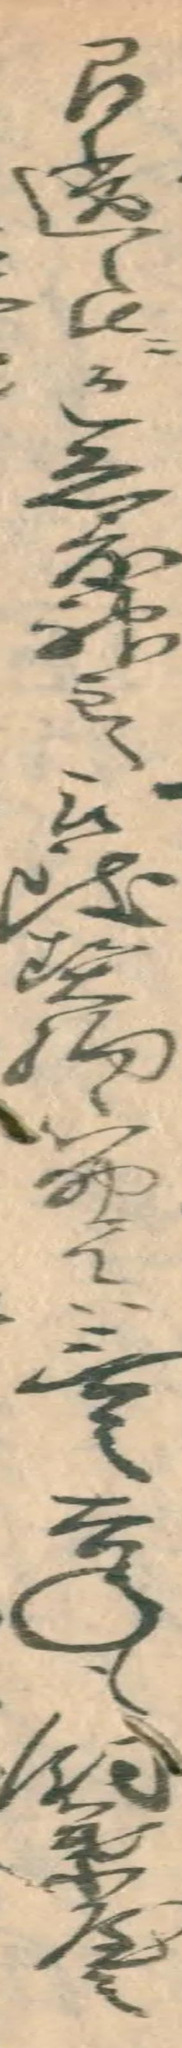間違之由ニ而急度神主へ被致契約候筋ニてハ無之去年も飼葉屋之
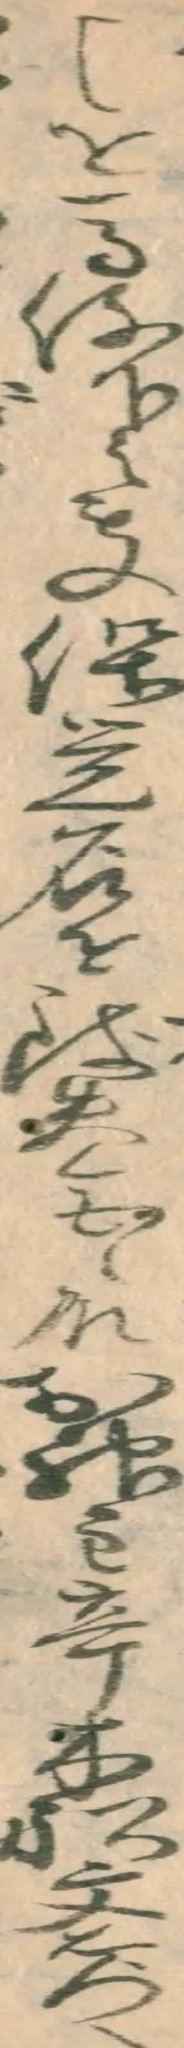申候を馬役下之もの保覚名を致失念候故於神主亭木船文右衛門へ
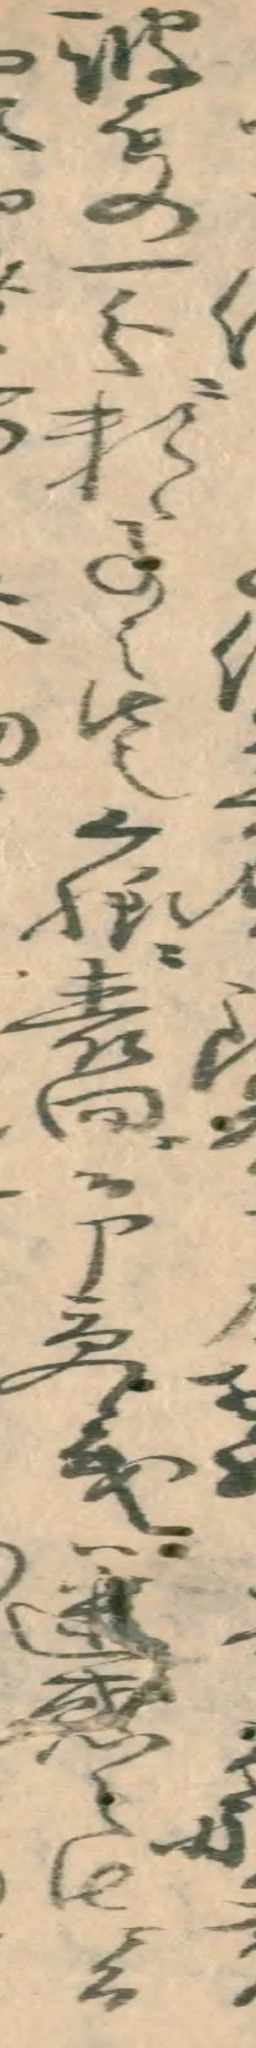彼もの一分ニ頼候事之由也ケ様ニ表向ニ而申受候義ハ迷惑之由ニ而
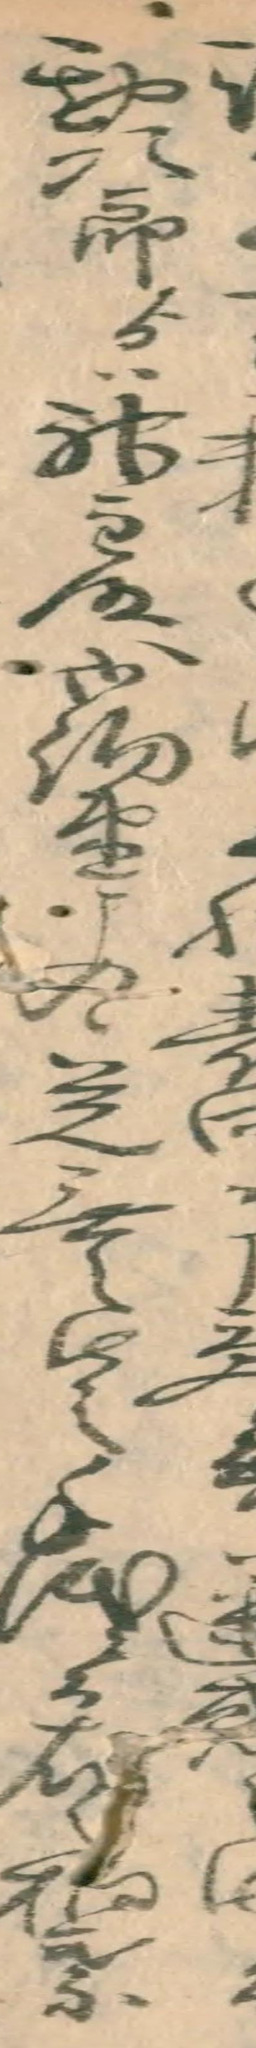勘次郎ゟハ神主殿へ御約束申入候覚無之由之手紙ニ而右之柏葉
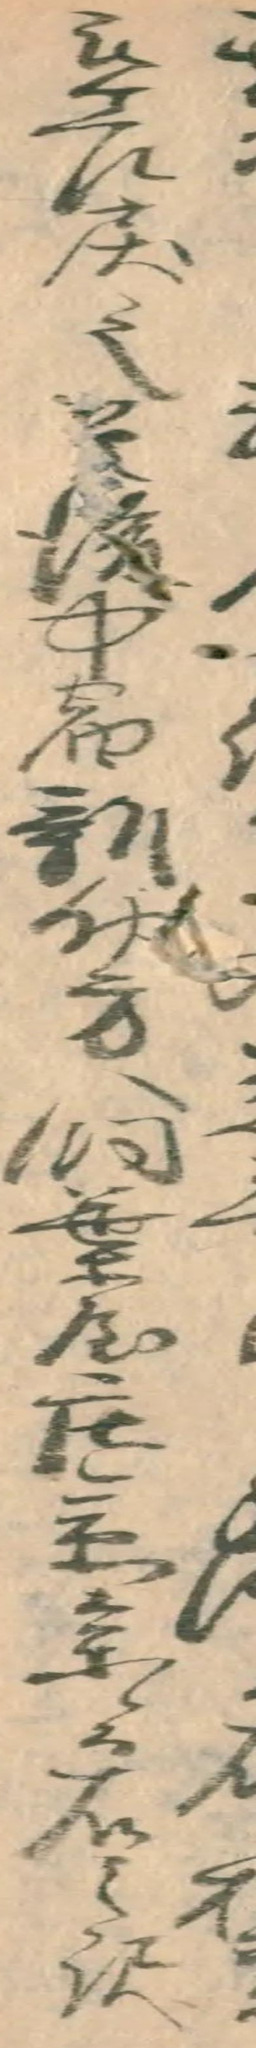被差戻候也其後中宿新助方へ飼葉屋庄兵衛参候而右之訳
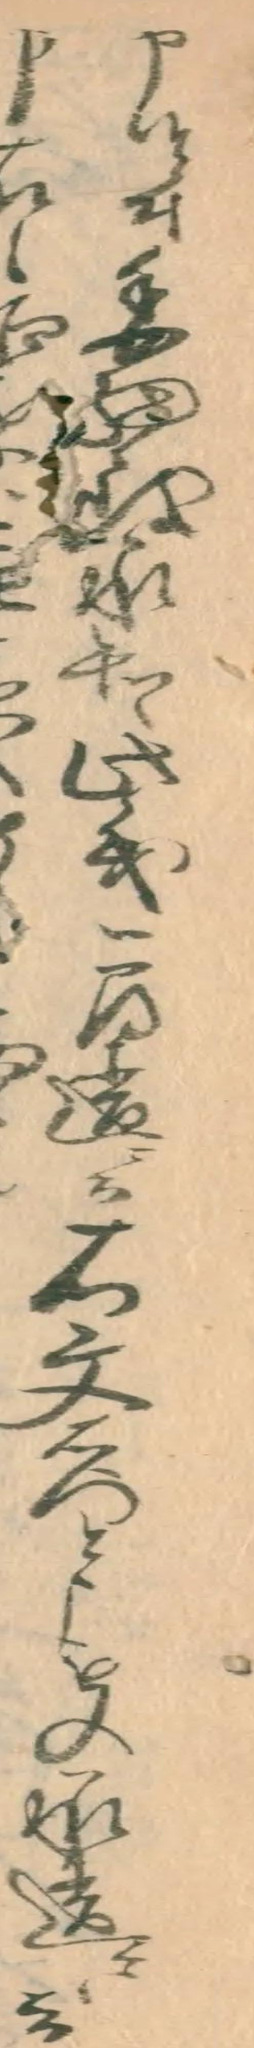申候ニ付委細致承知候此義ハ間違ニ而右文右衛門と申もの承違ニ候旨
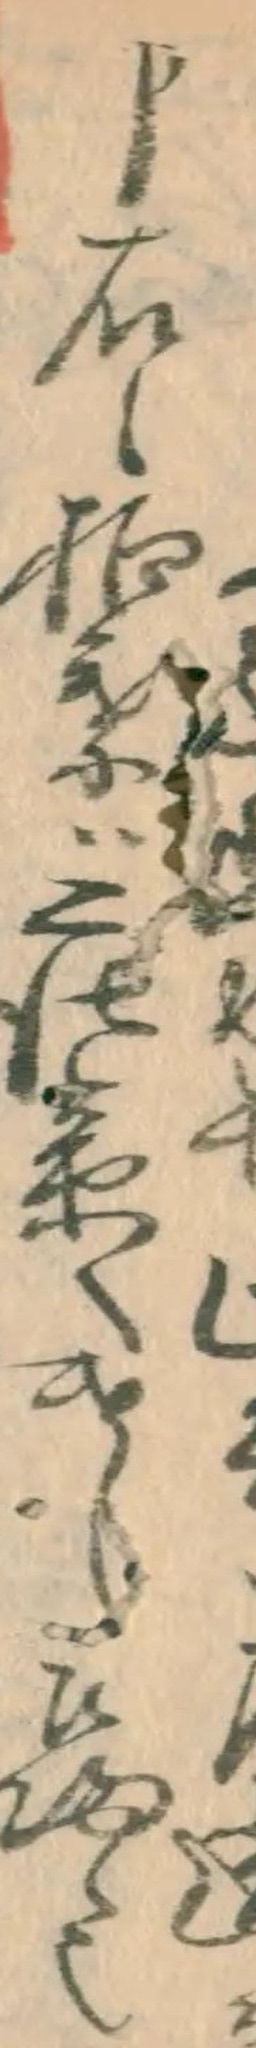申右之柏葉ハ庄兵衛へ遣し被帰候也
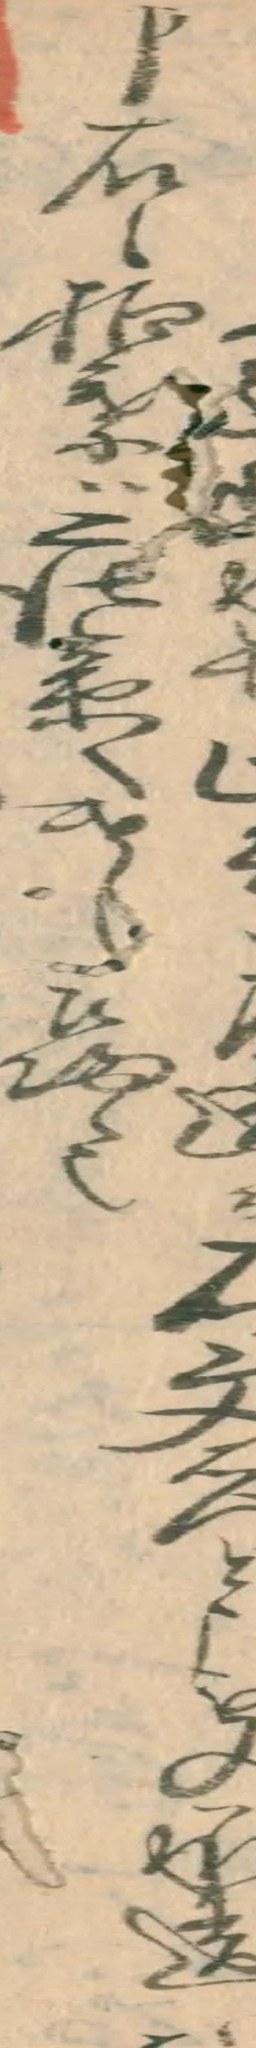申右之柏葉ハ庄兵衛へ遣し被帰候也
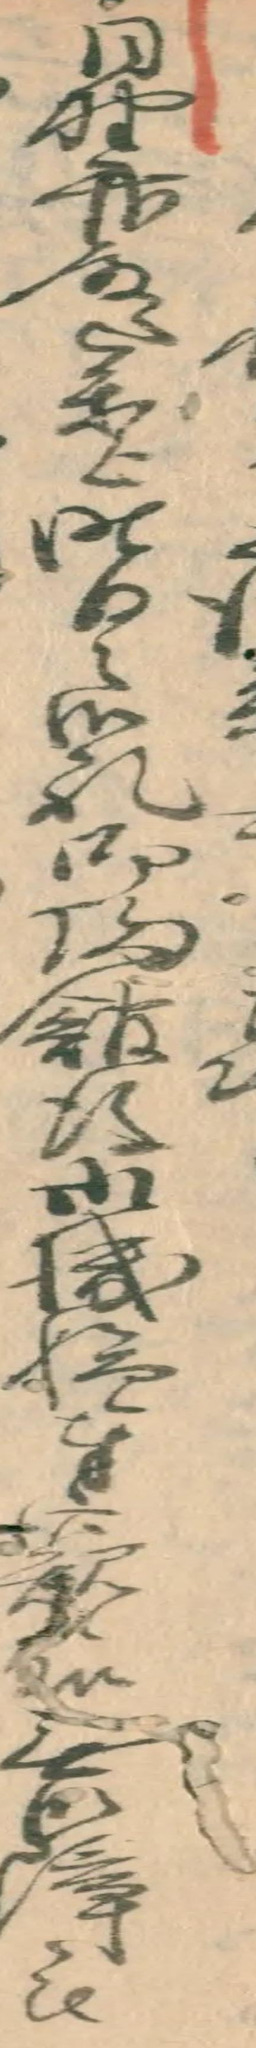一日野弁殿参へ参上昨日之御礼御帰館後御機嫌奉窺候処無御障被
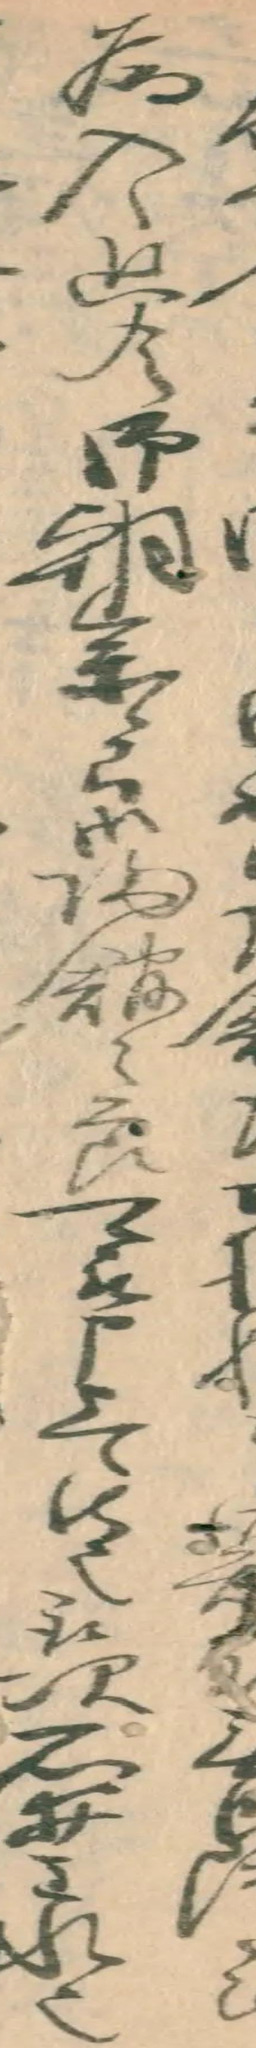為入候只今御朝参候間御帰館之節可被申上候由也取次石井主水也
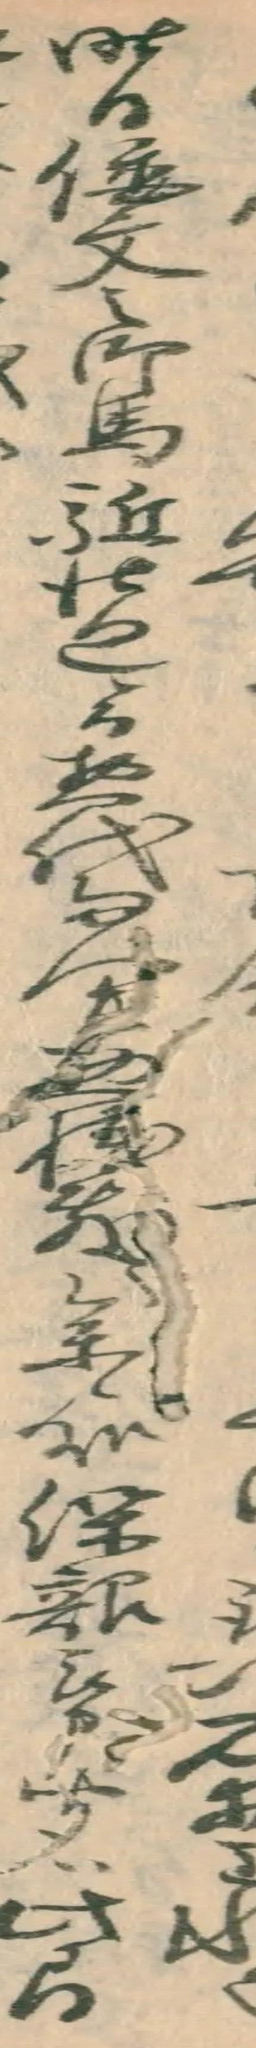一昨日倭文之御馬駈仕廻候而惣代両人共両惣桟敷参候処保韶被聞ハ此間
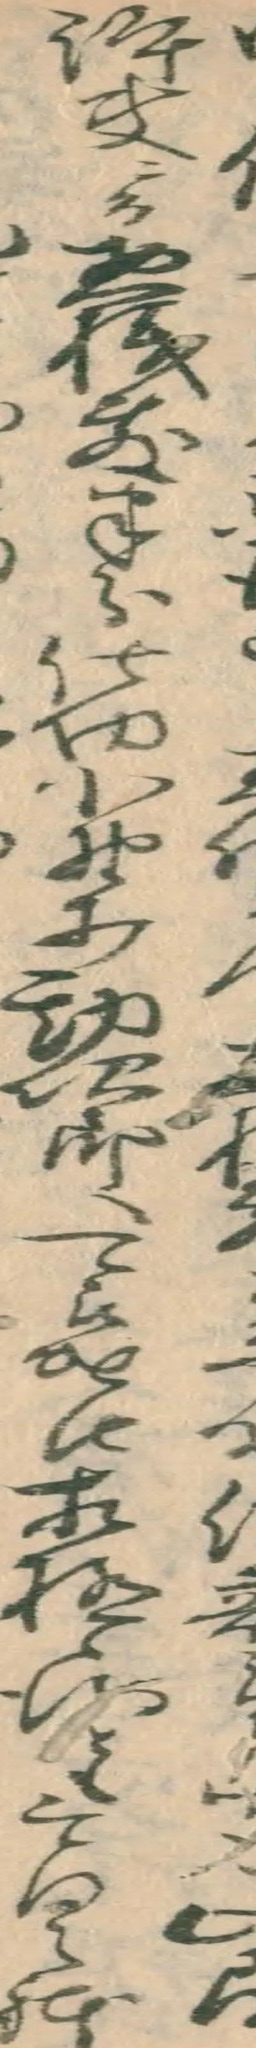評決ニ而惣桟敷半分仕切小野打勘次郎へ可被遣由相極候得とも今日之体
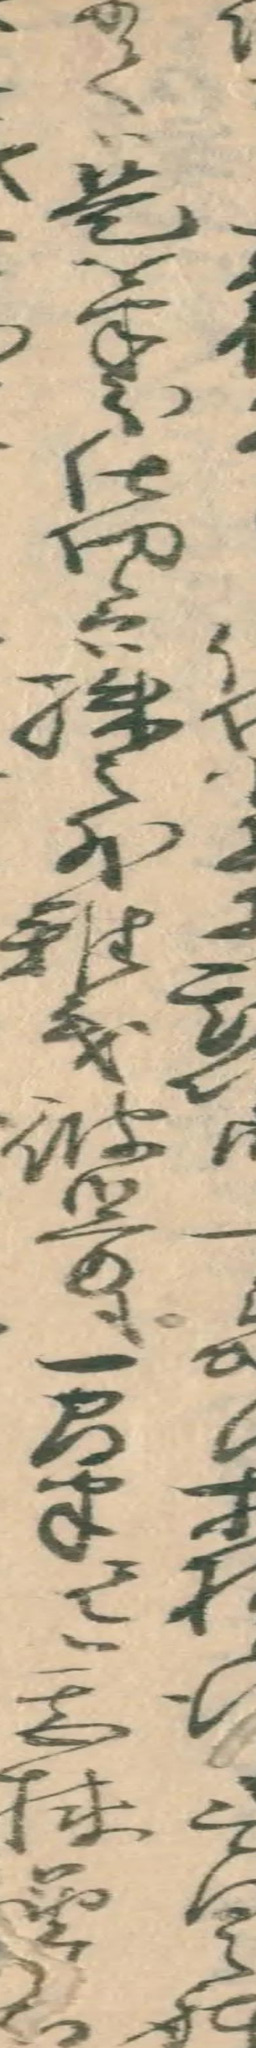にてハ是を半分仕切候而ハ殊之外難義彼御方も一間半ニてハ甚狭御座
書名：賀茂社記録. 第58冊
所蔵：国立国会図書館 National Diet Library, JAPAN
